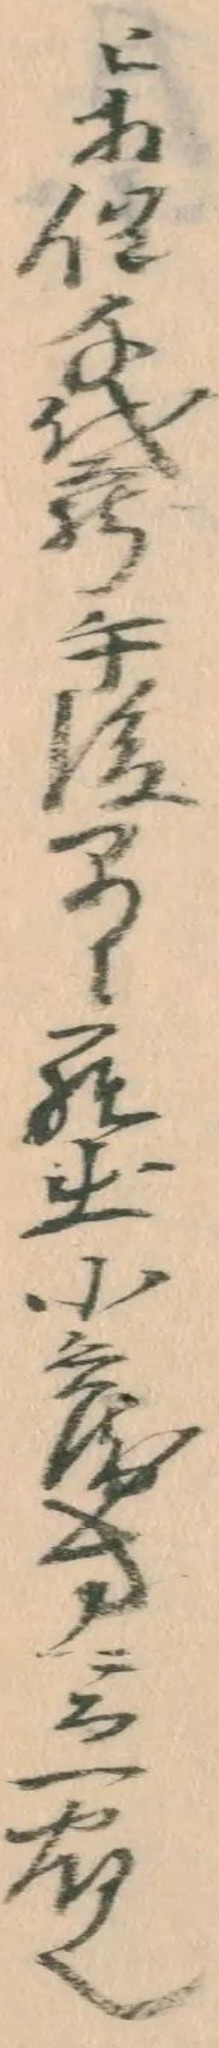被相催手代蔵午後早〻罷出小兵衛方ニ而一宿也
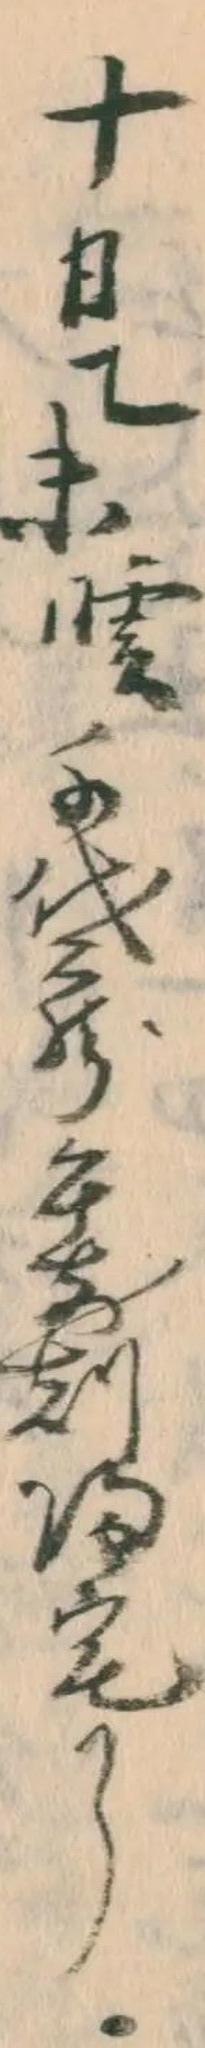十日乙未晴千代蔵午前刻帰宅了
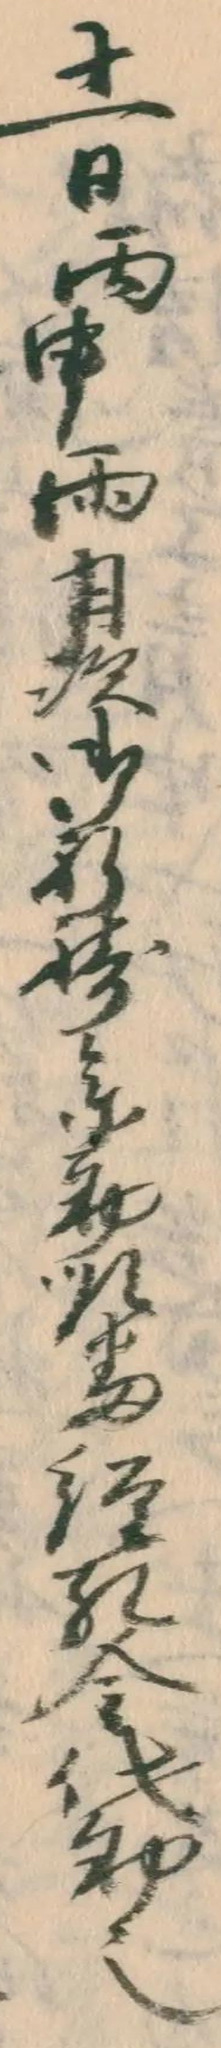十一日丙申雨月次御祈祷参勤順番経紀令代勤也
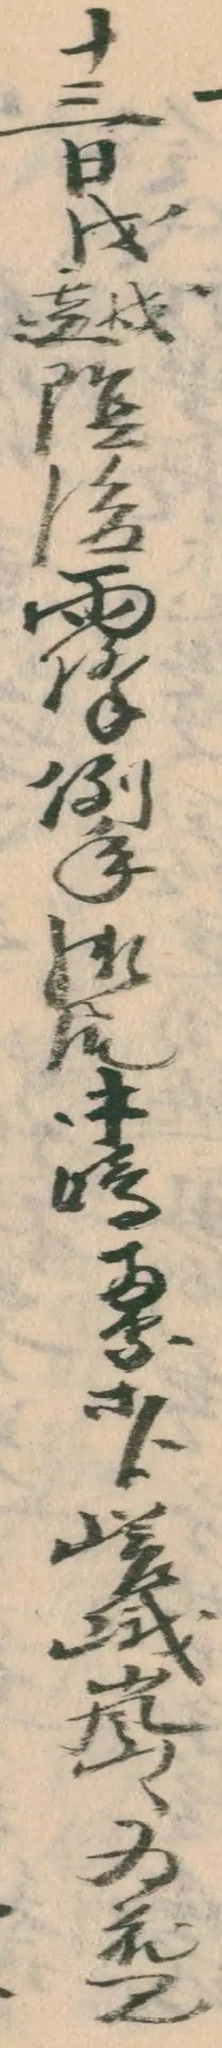十三日戊戌陰後雨降例年瀬尾中嶋両家等ゟ嵯峨嵐山へ為花見
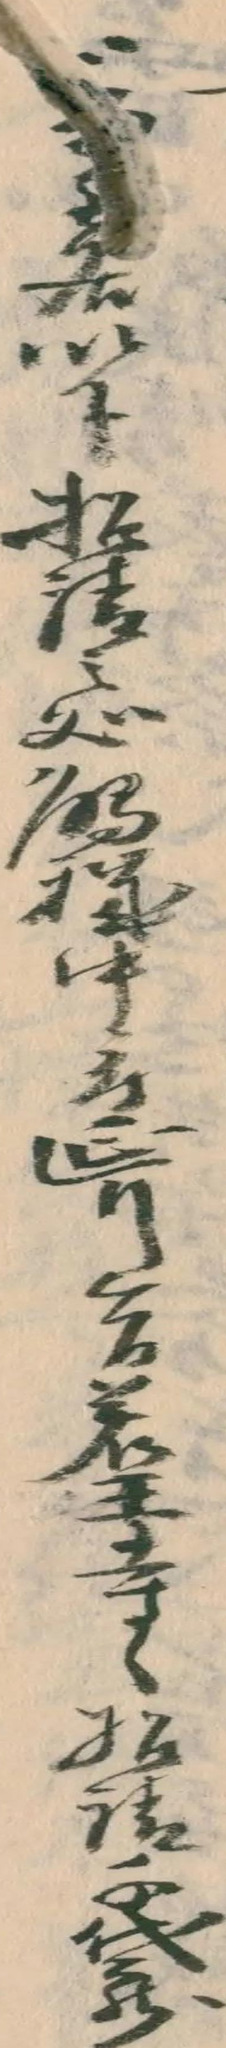御各以下招請之処触穢中ニ付延引今日若王寺へ招請千代蔵
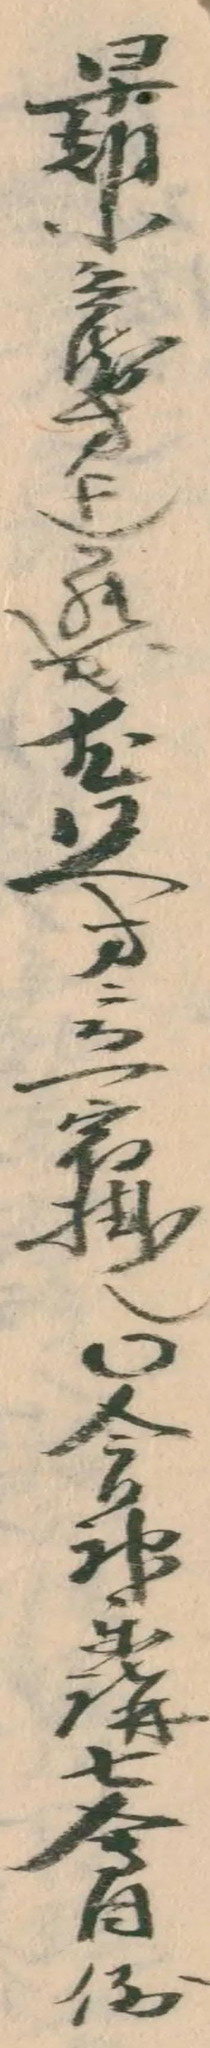早朝小兵衛方迄罷出尤同人方ニ而一宿掛之〇今日神楽講七會目例
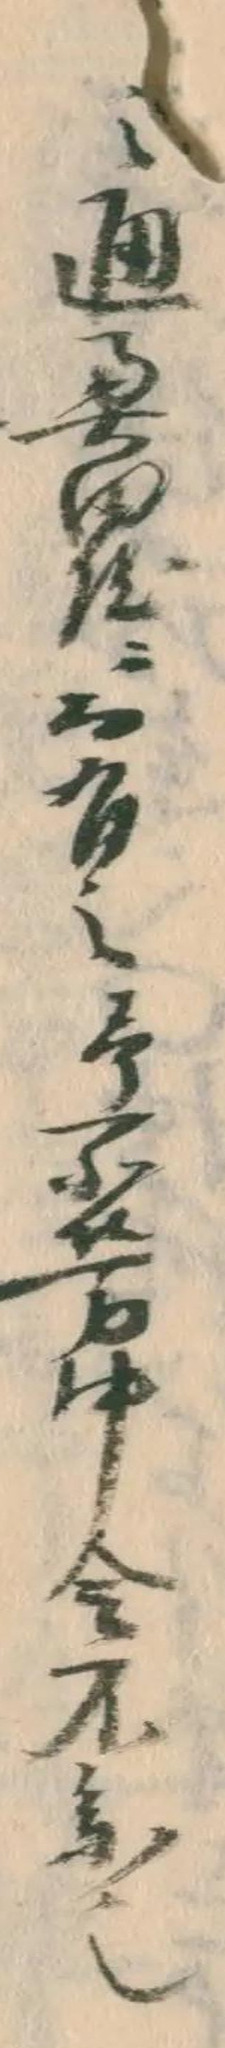之通奥田屋ニ而有之予所労中令不参也
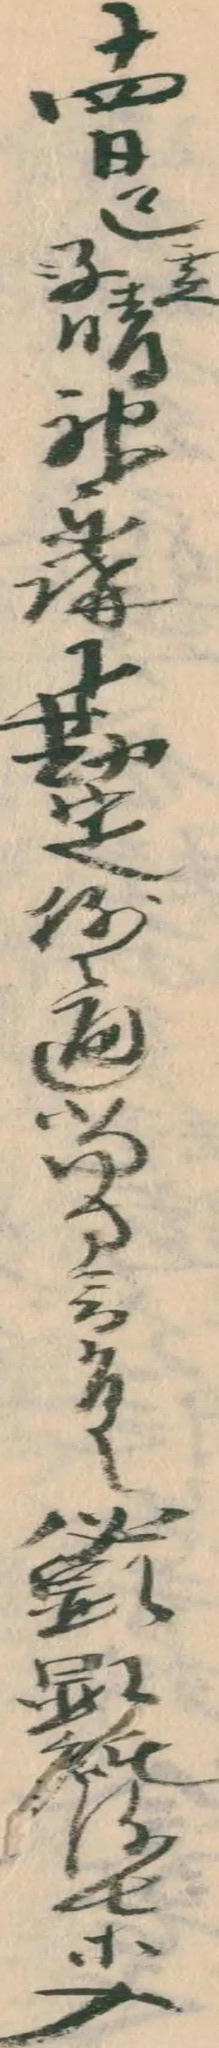十四日己亥晴神楽講下勘定例之通當方ニ而有之必顕純後七等入
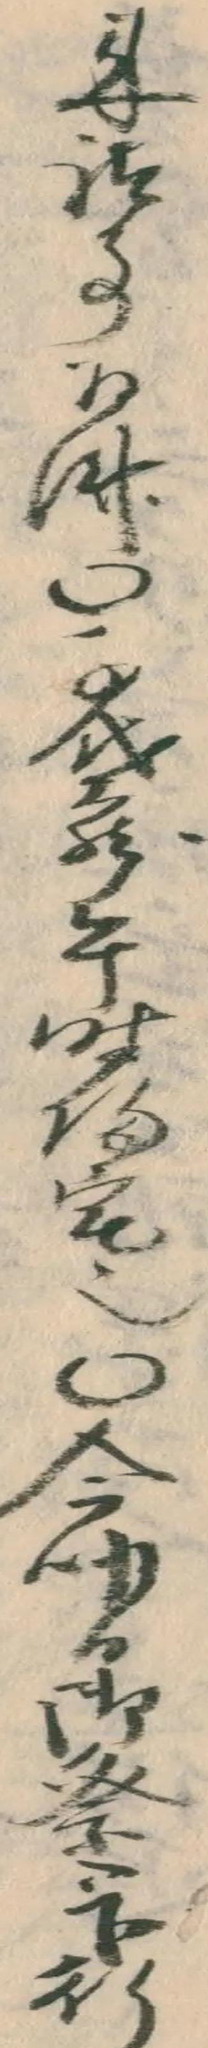来請事相済◯手代蔵午時帰宅也○今明日御祭御下行
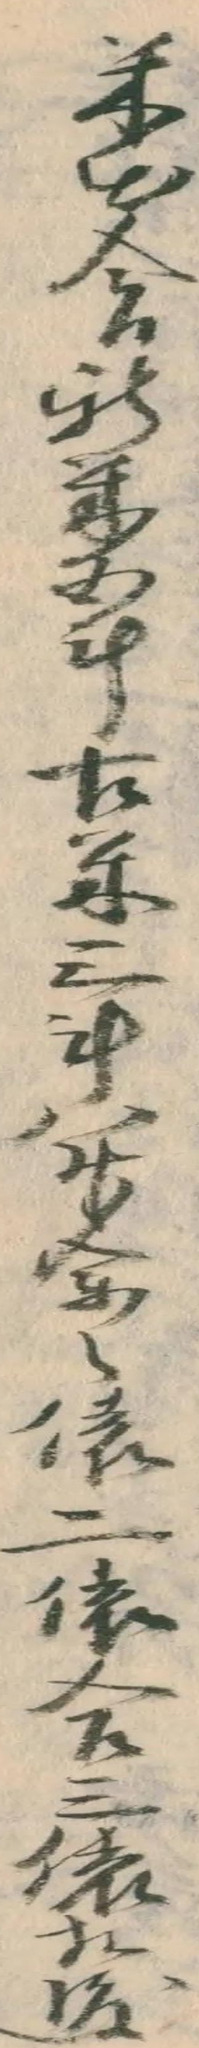米出今日新米五斗古米三斗八升余之俵二俵合三俵相渡也
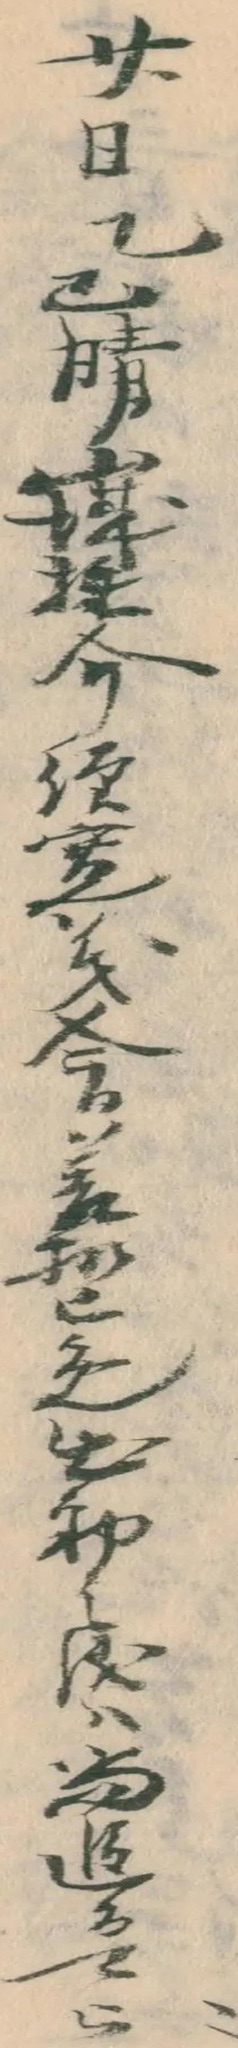廿日乙巳晴山城権介経寛義今日差押被免出勤之儀ハ尚追而可被
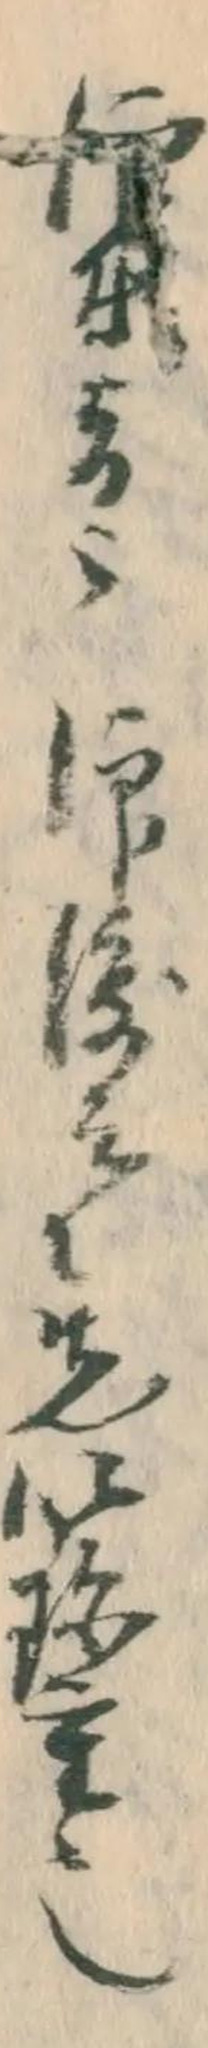仰付旨被仰渡云々先以珍重也
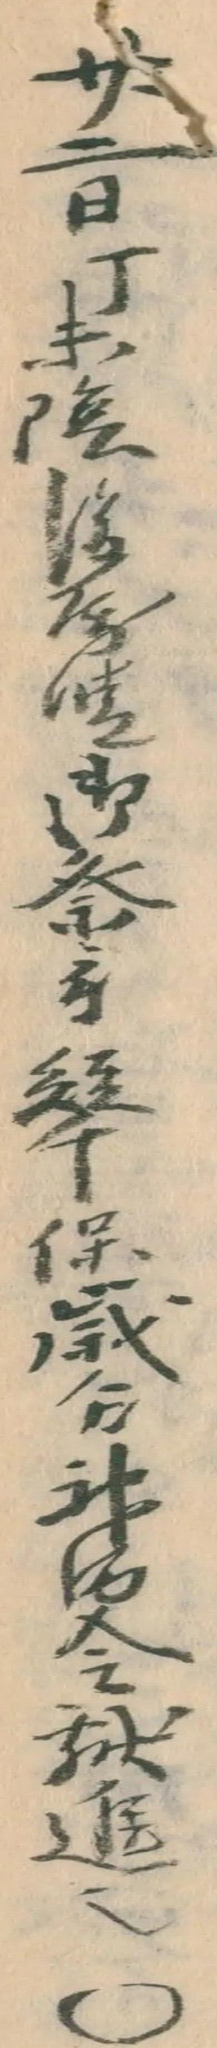廿二日丁未陰後属晴御祭ニ付経千保歳分神酒献進也○

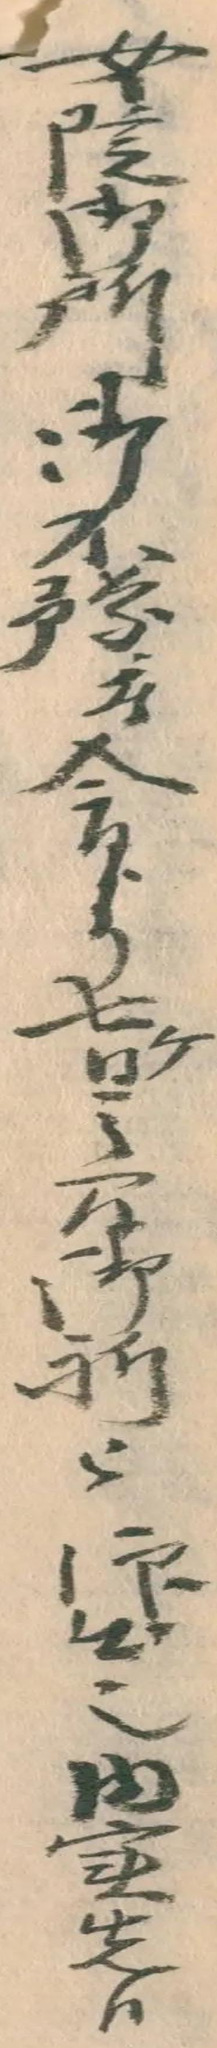女院御所御不豫ニ付今より七ヶ日之間御祈被仰出也内実先日
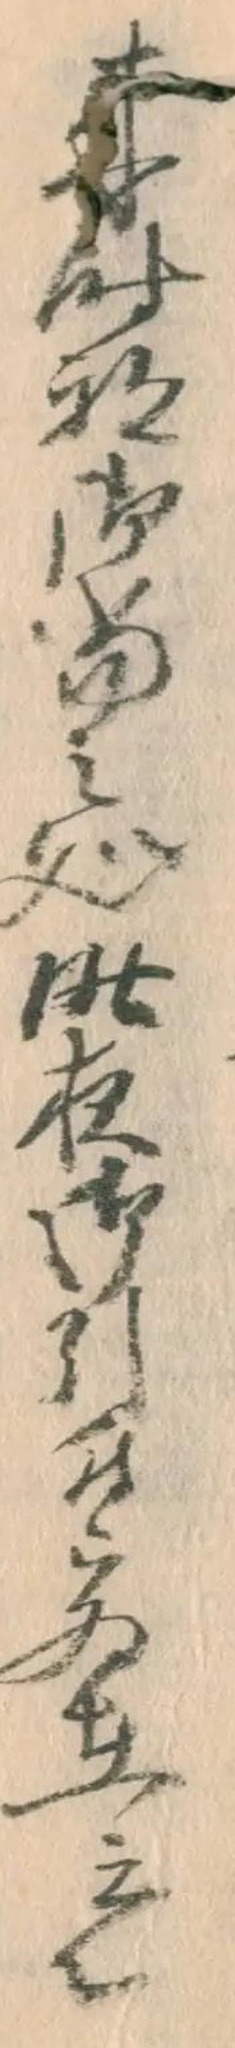来時朝御當之処昨夜御引ニ付被為在云々
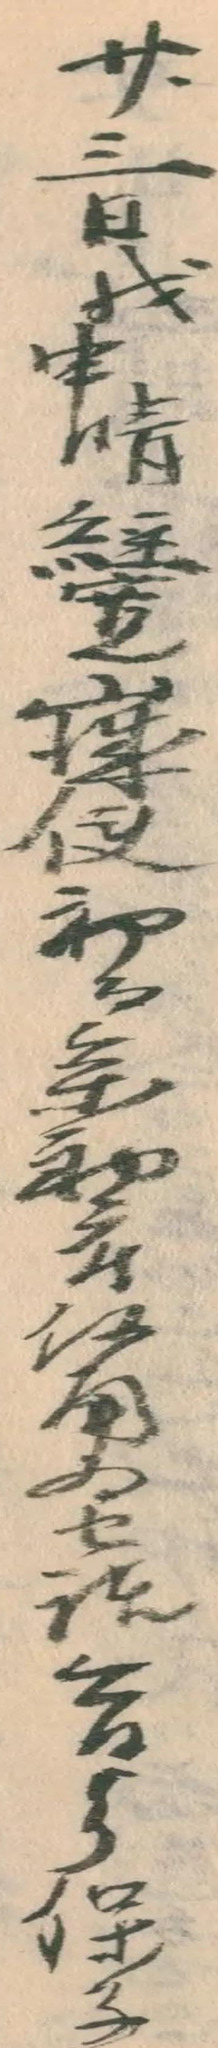廿三日戊申晴経寛山城使初而参勤ニ付何角為世話今日より保子
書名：賀茂社記録. 第70冊
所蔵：国立国会図書館 National Diet Library, JAPAN
